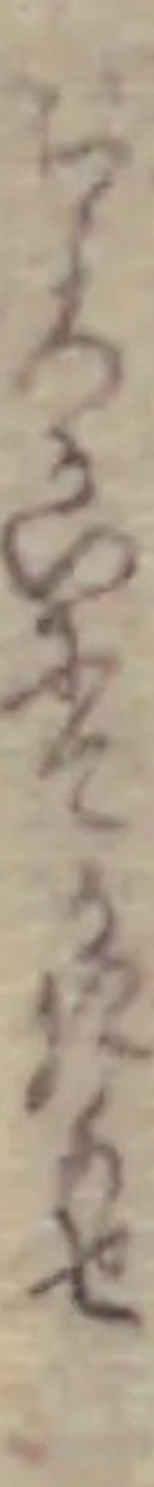ちよつかいにてかきよせ
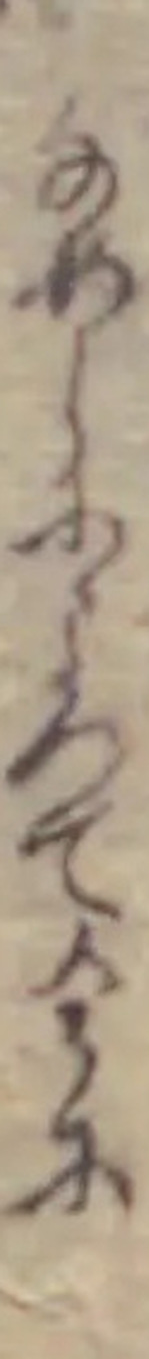なめらふよつて今に
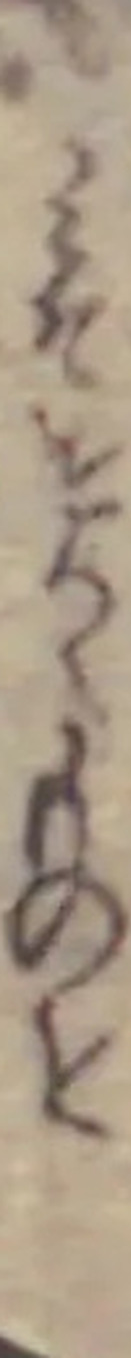みそをかくものを
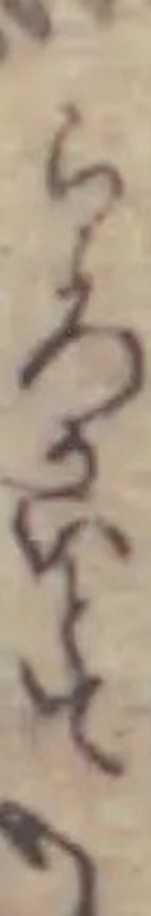ちよつかいとて
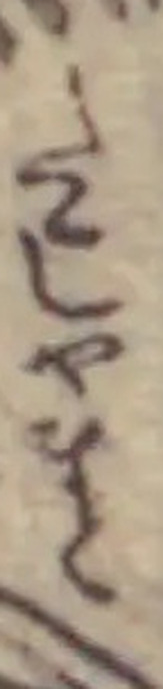たゝしやまと
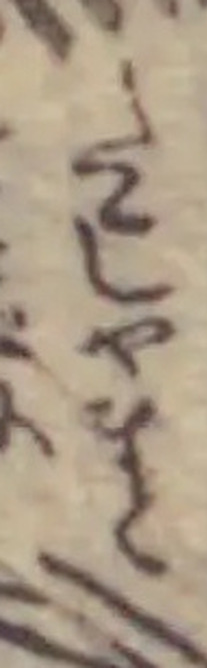たゝしやまと
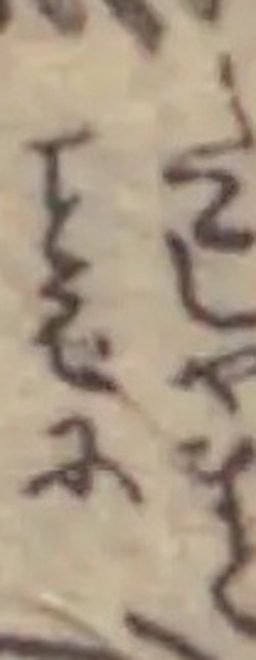ことばに
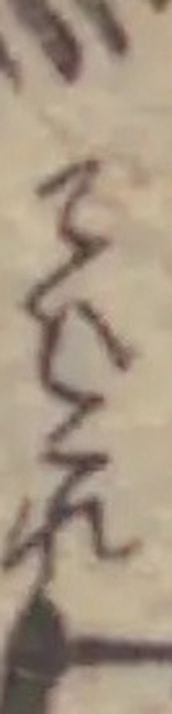てはこれ
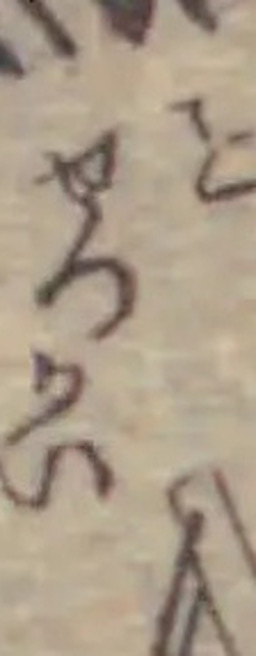せつかい
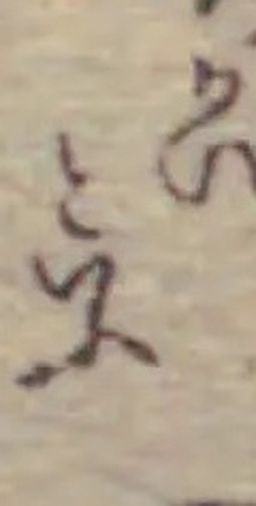といふ

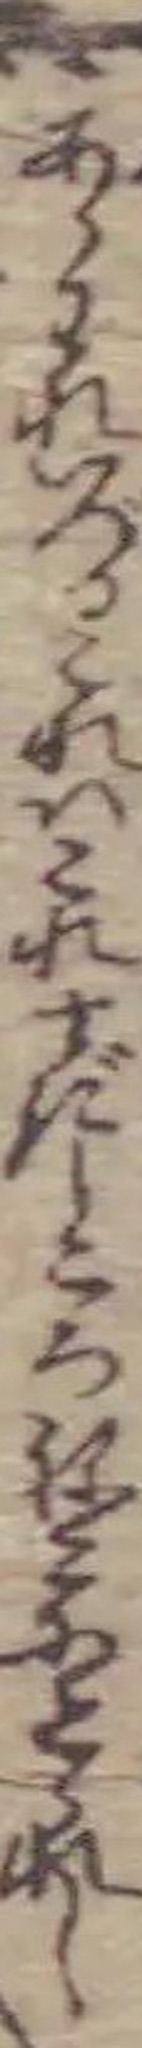あらわれいづるこれはこれすぎしころねこにとられし
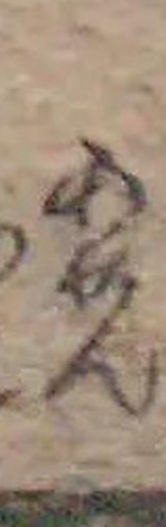あめん
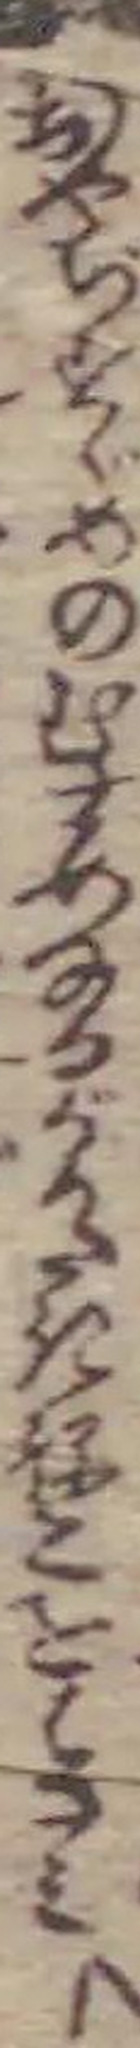おやぢすゞめのむすめなるがかたきねこをはさみ
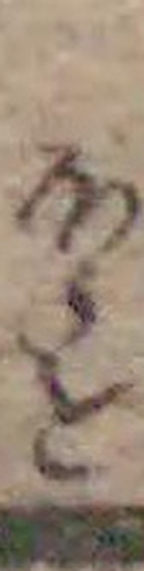ほうを
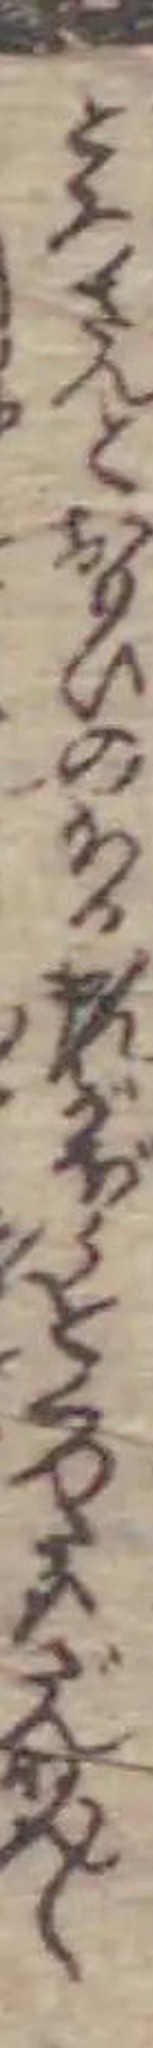ころさんとおもひのほかれがぼうをくつたはざんねん〳〵
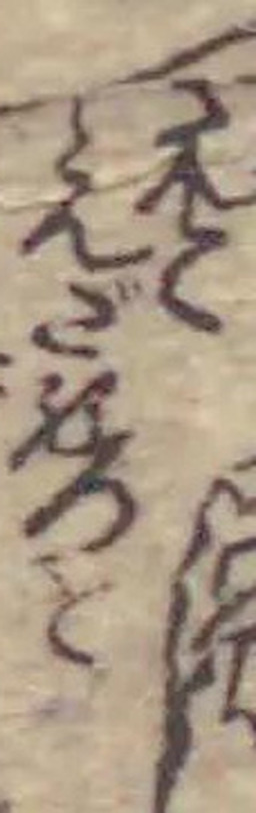とんだねつを
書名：冷水灰毛猫 2巻
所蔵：国立国会図書館 National Diet Library, JAPAN
